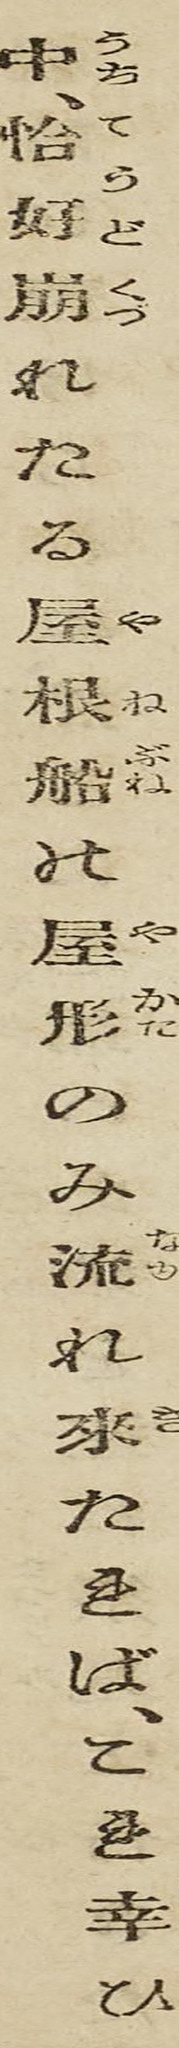中、恰好崩れたる屋根船の屋形のみ流れ来たれば、これ幸ひ
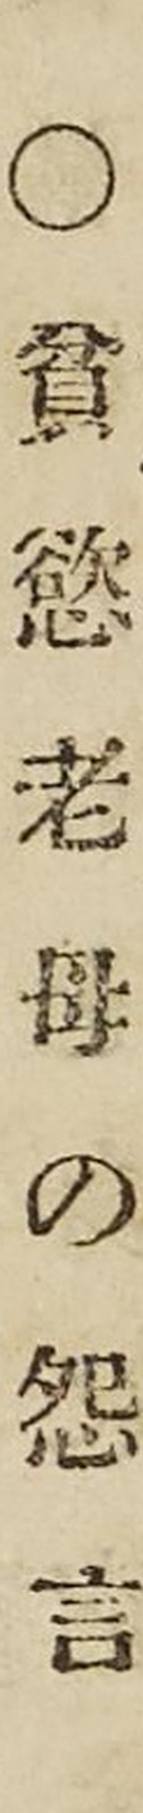○貪欲老母の怨言
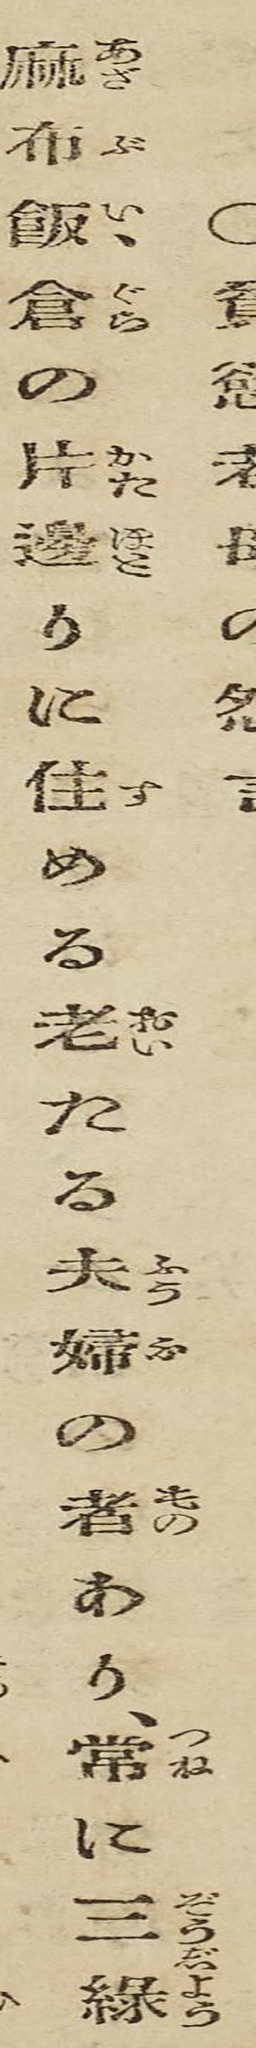麻布飯倉の片辺りに住める老たる夫婦の者あり、常に三緑
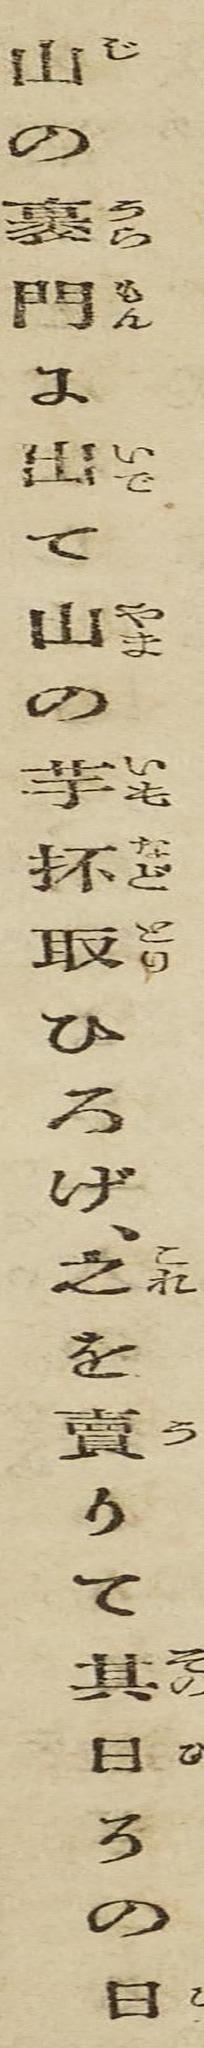山の裏門に出て山の芋抔取ひろげ、之を売りて其日その日

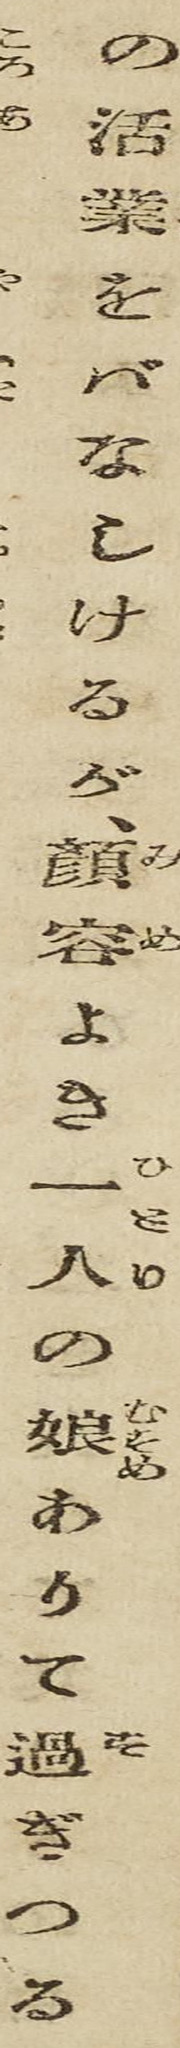の活業をばなしけるが、顔容よき一人の娘ありて過ぎつる
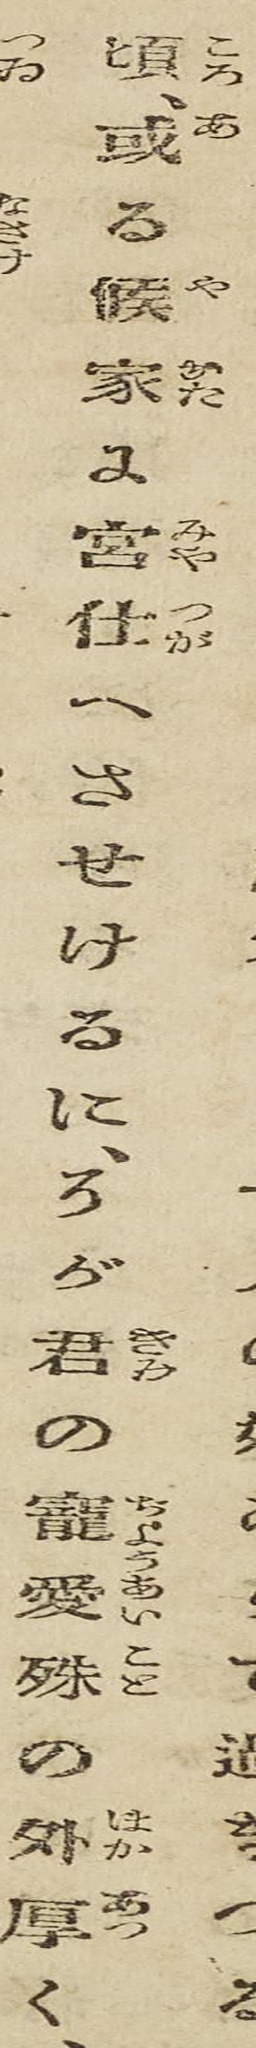頃、或う侯家に宮仕へさせけるに、そが君の寵愛殊の外厚く、
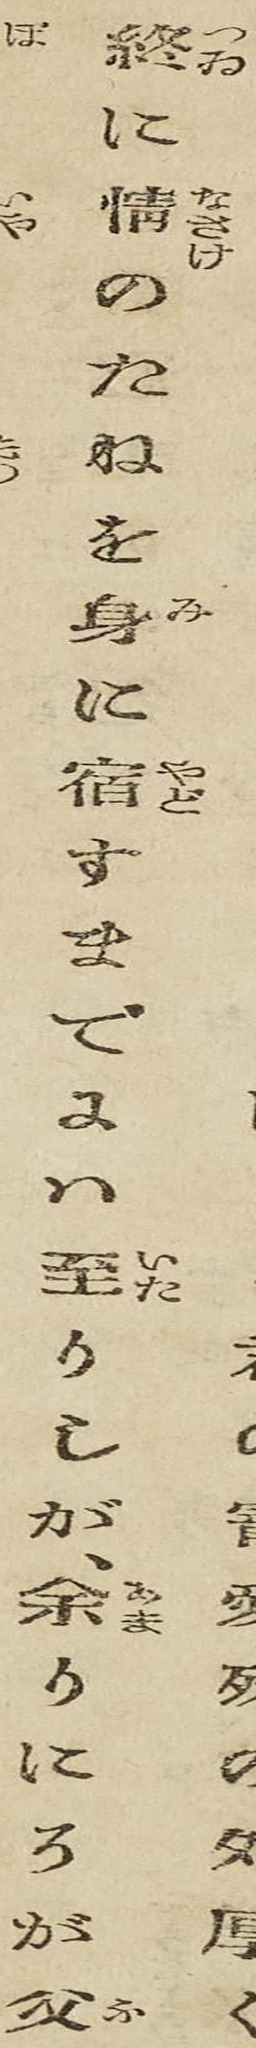終に情のたねを身に宿すまでには至りしが、余りにそが父
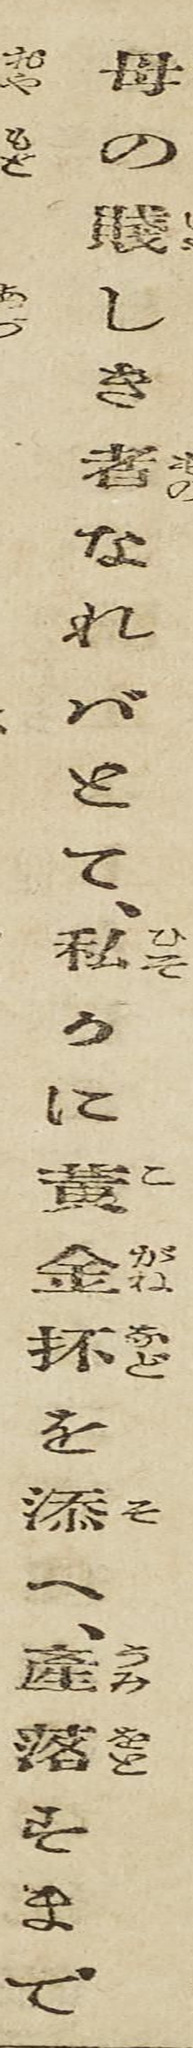母の賎しき者なればとて、私かに黄金抔を添へ、産落すまで
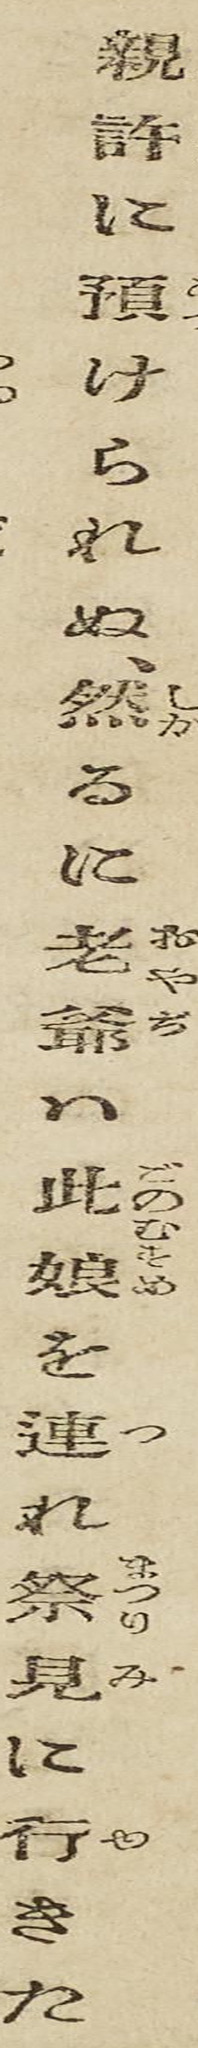親許に預けられぬ、然るに親爺は此娘を連れ祭見に行きた
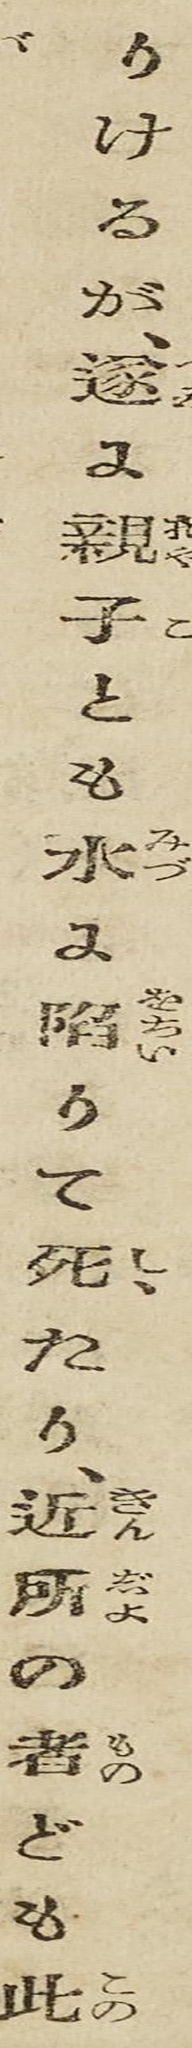りけるが、遂に親子とも水に陥りて、死たり、近所の者ども此
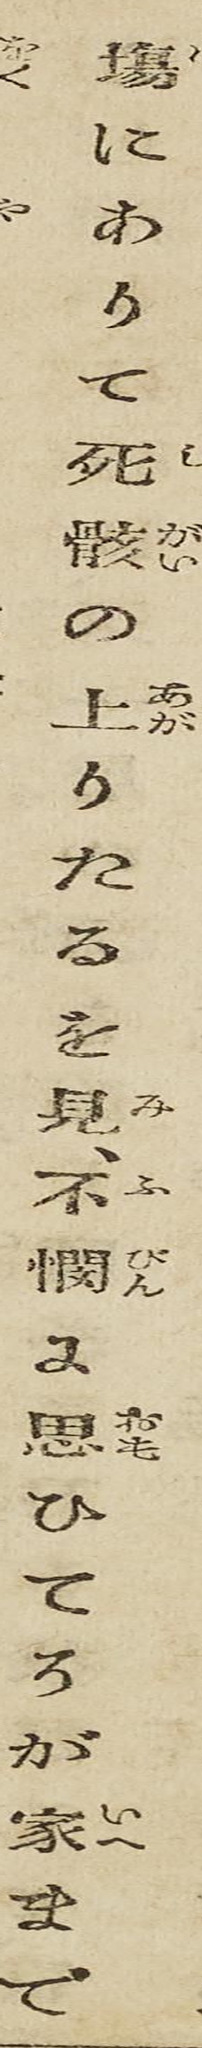場にありて死骸の上りたるを見、不憫に思ひてそが家まで
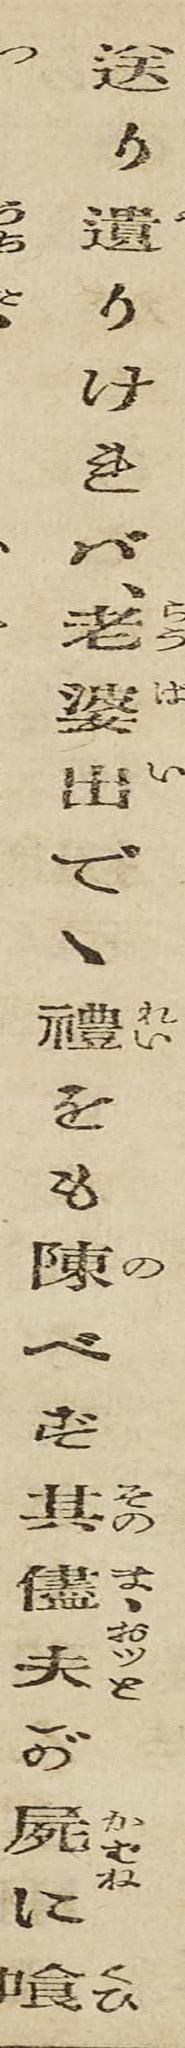送り遣りければ、老婆出でゝ礼をも陳べず其侭夫が屍に喰
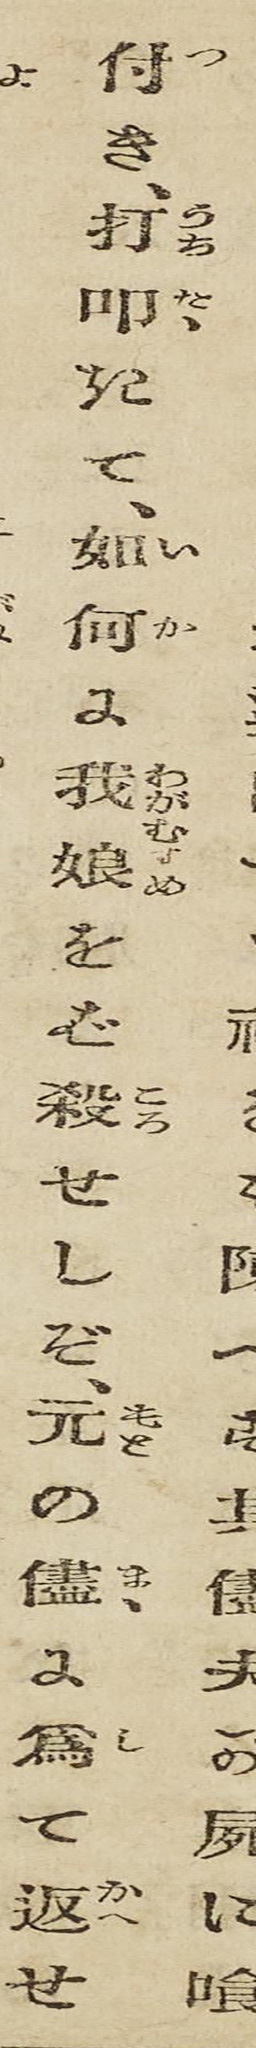付き、打叩きて、如何に我娘をば殺せしぞ、元の侭に為て返せ
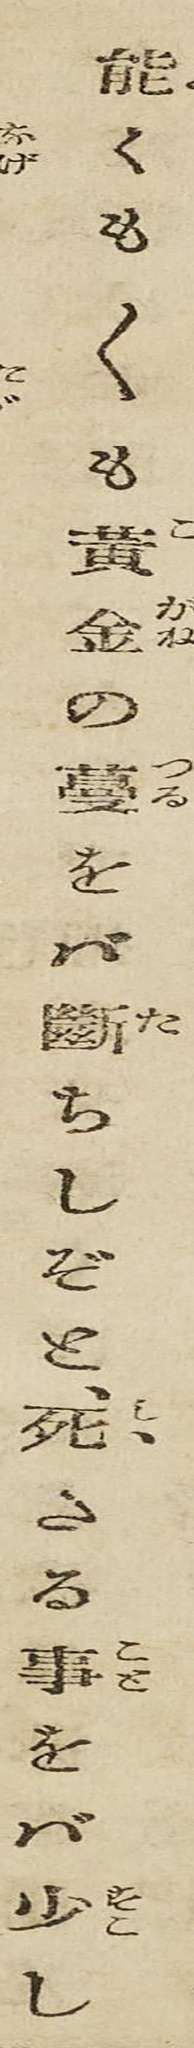能くも〳〵も黄金の蔓をば断ちしぞと、死たる事をば少し
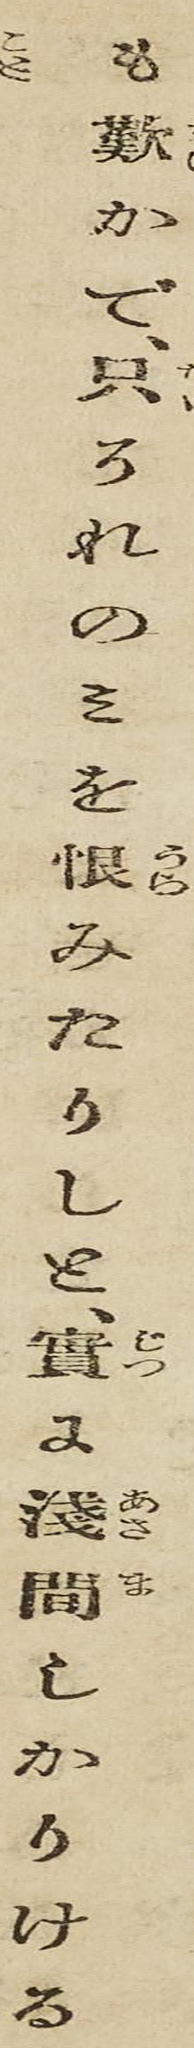も歎かで、只それのみを恨みたりしと、実に浅間しかりける
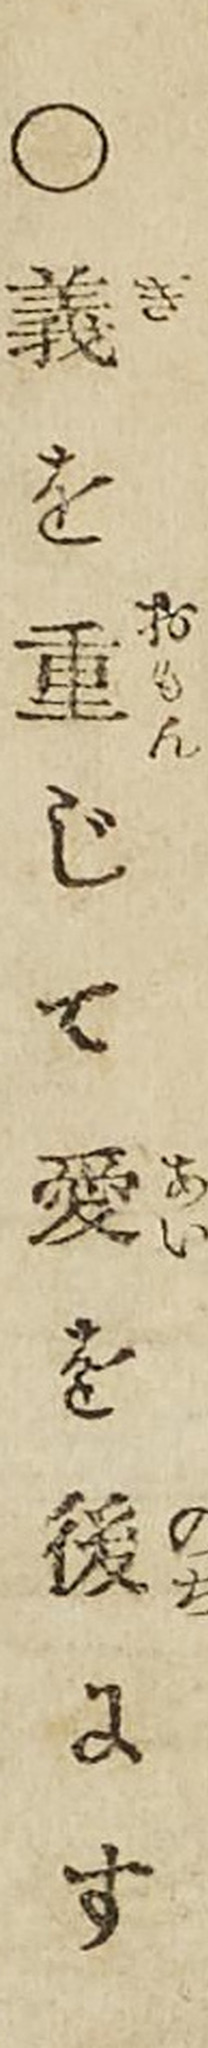○義を重んじて愛を後にす
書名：永代惨話　文化の夢　全
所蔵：東京大学地震研究所図書室 Earthquake Research Institute Library, The University of Tokyo, JAPAN
